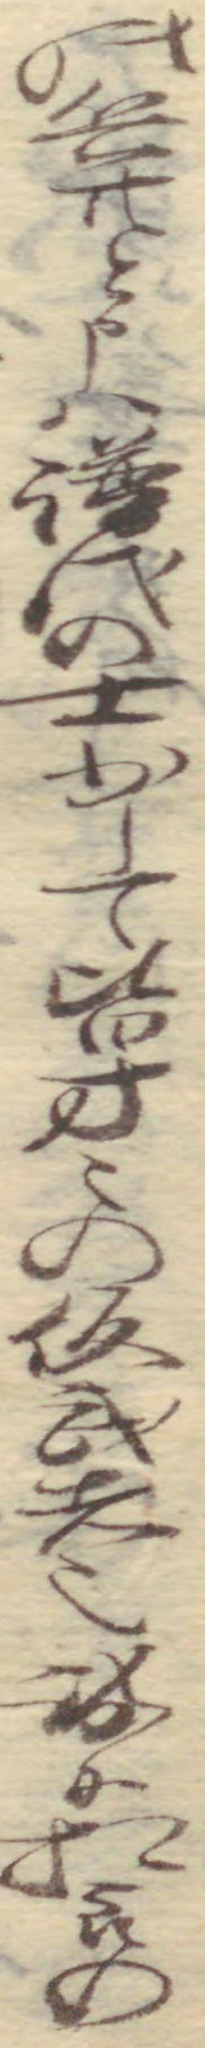の兵共と申は譜代の士少して皆方々の仮武者也誠に相良の
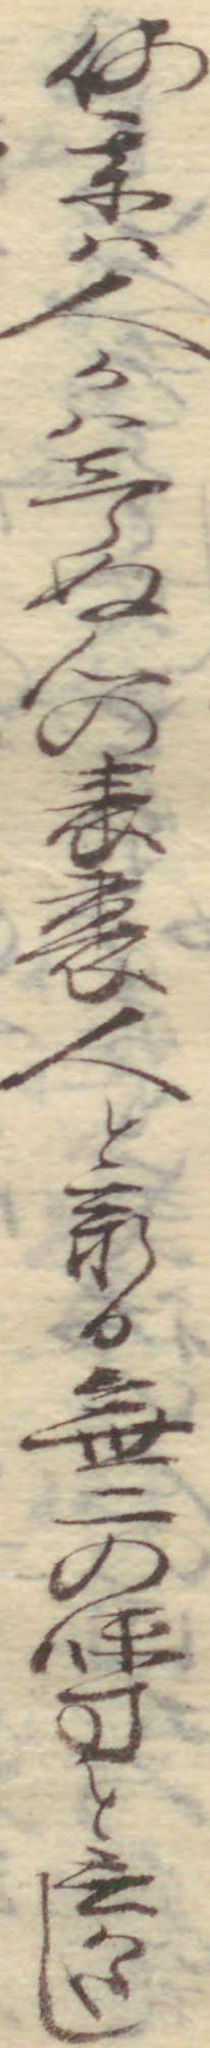何某は人かはしらぬ心の表裏人と承る無二の味方と云かたし
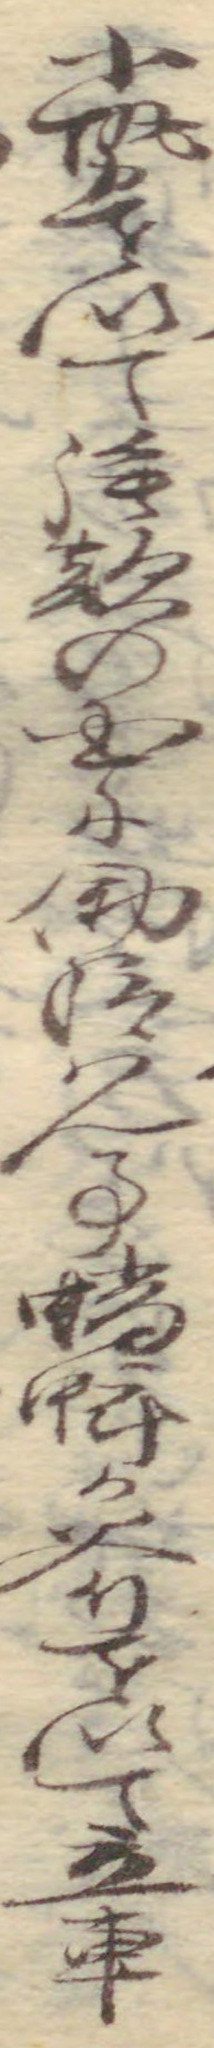小勢を以て強敵の国に働給はん事蟷螂の斧を以て立車
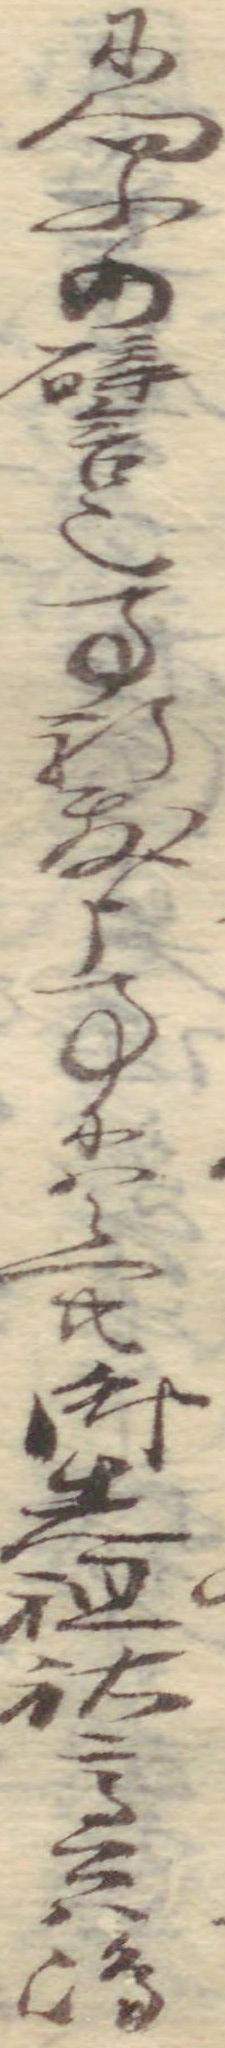に向うの譬也事新敷申事には候へ共御先祖祐高公は嶋
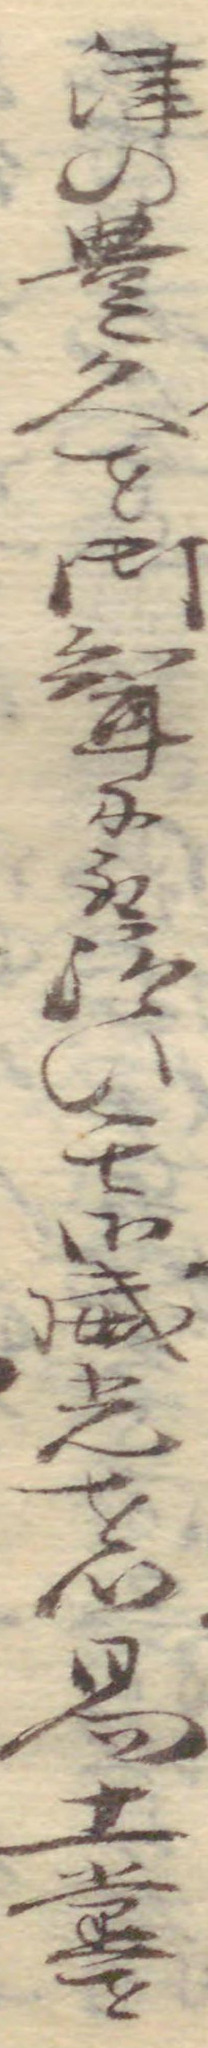津の豊久を御聟に取給ひ其御威光を以日向土党を
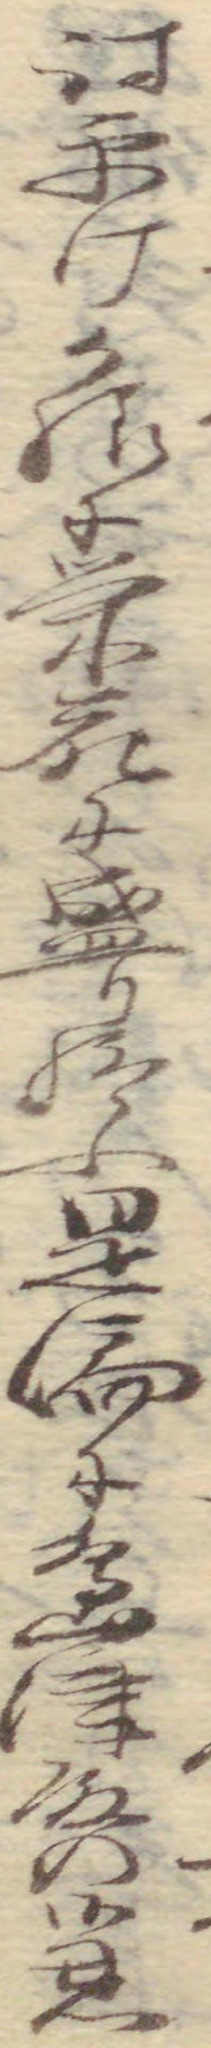討平けか様に栄花に盛り給ふ是偏に島津殿の御恩
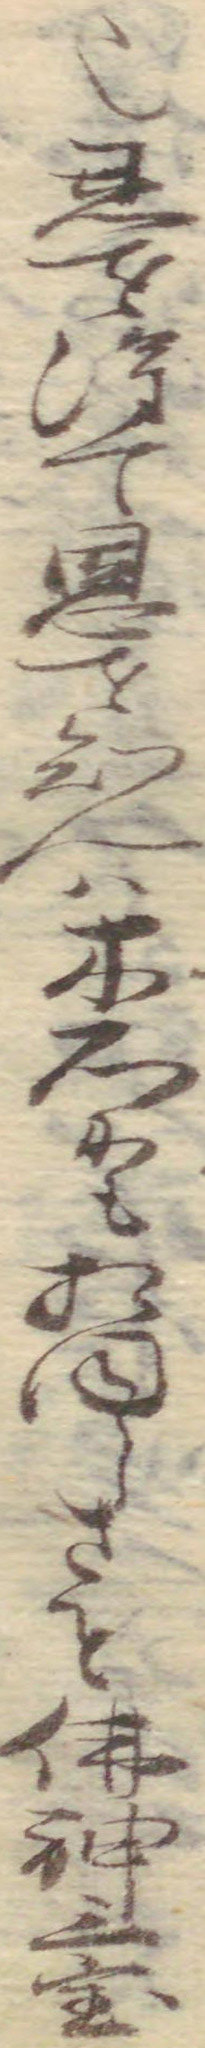也恩を得て恩を知んは木石にも相同しさそ佛神三宝
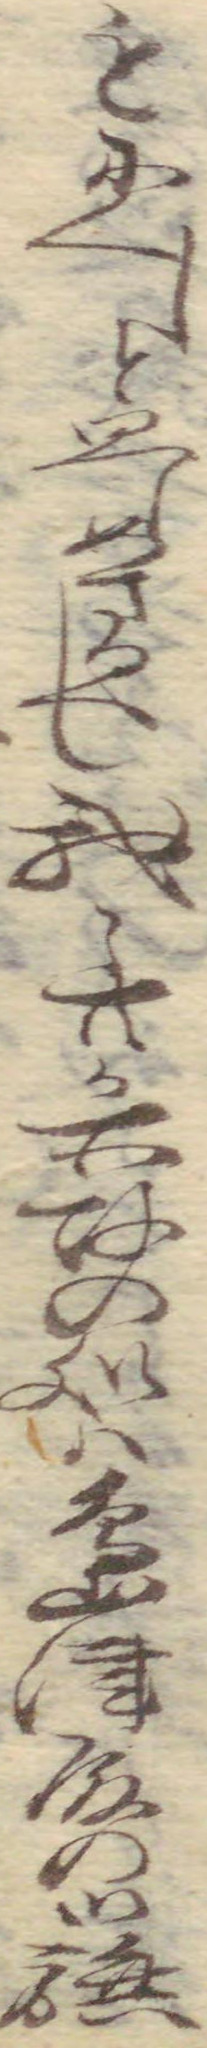もにくしと思しめさるへし我々共か所存の処は島津殿の御旗
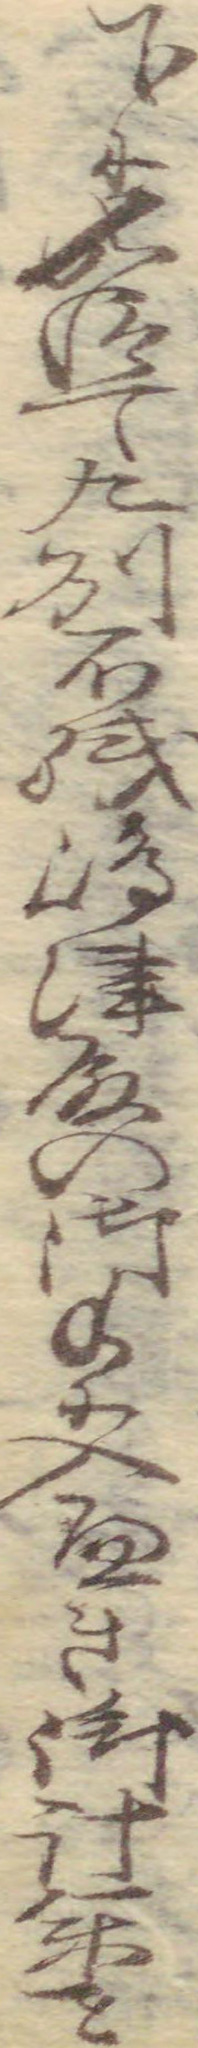下に成給て九州不残嶋津殿の御手に入へき御計策を
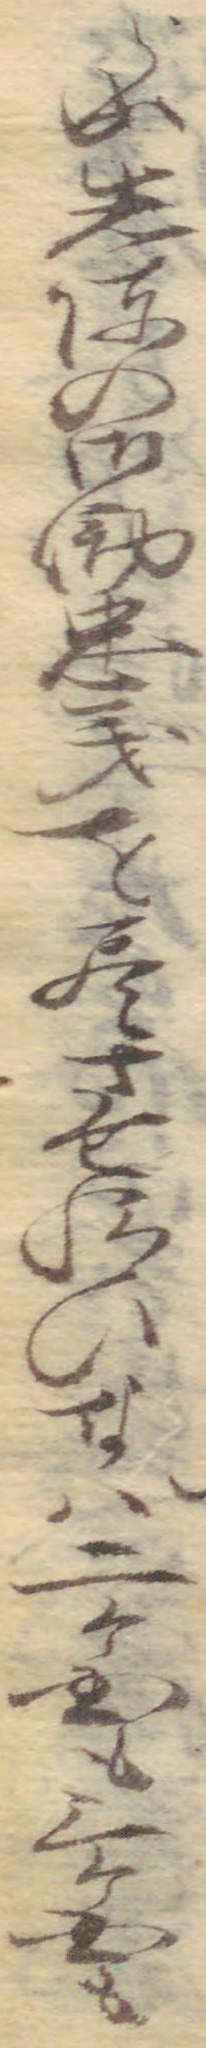被成先陣の御働忠義を尽させ給ひなは二ケ国も三ケ国も

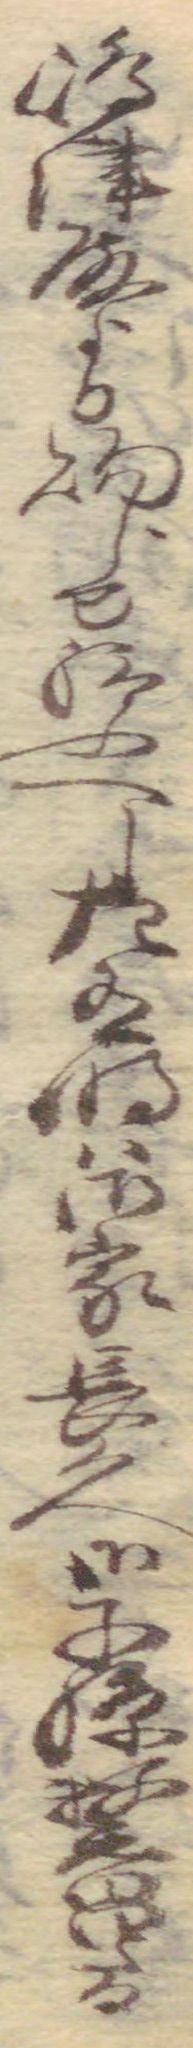嶋津殿より賜らせ給ふへし左有時は御家長久御子孫繁昌たる
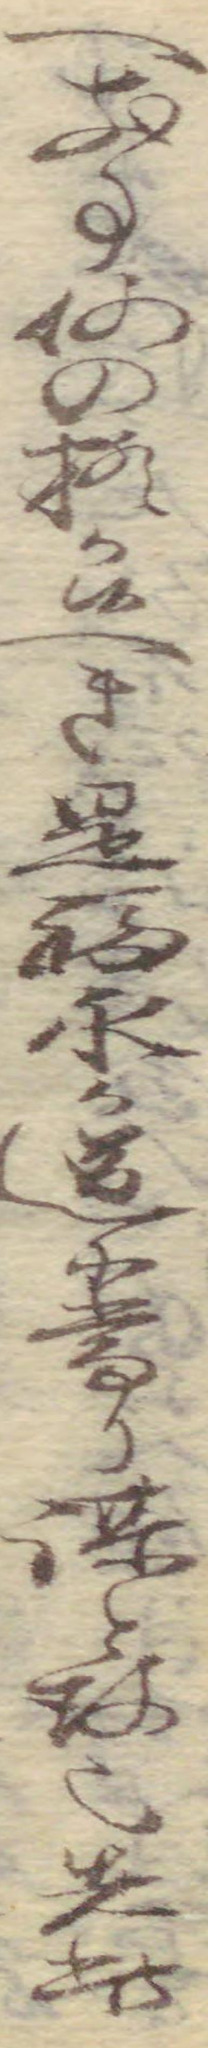へき事何の疑か候へき是福永か道に当り謀と存也先此
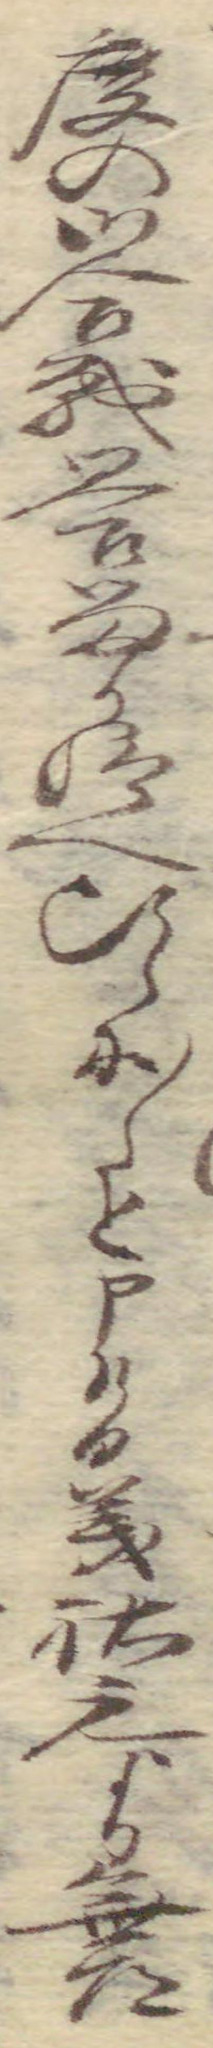度の御合戦思召留り給へひらに〳〵と申ける義祐元より無道
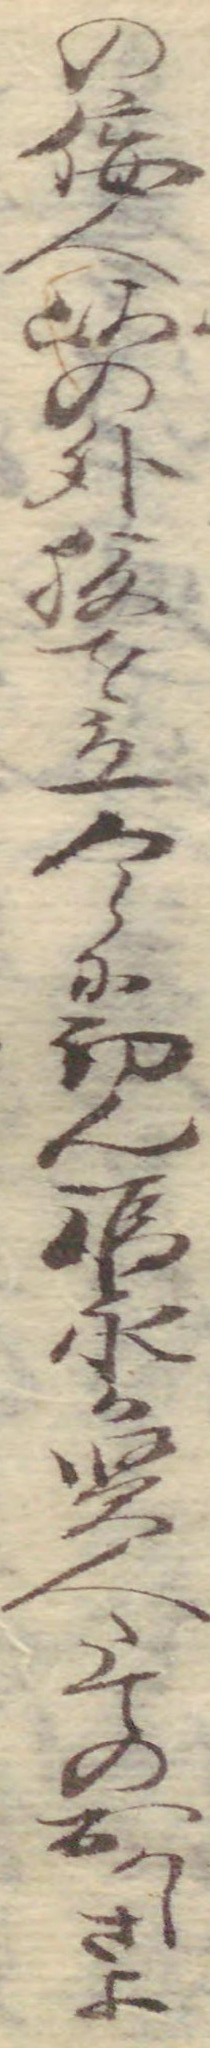の佞人以の外腹を立今に勤ん福永か賢人たてのおかしさよ
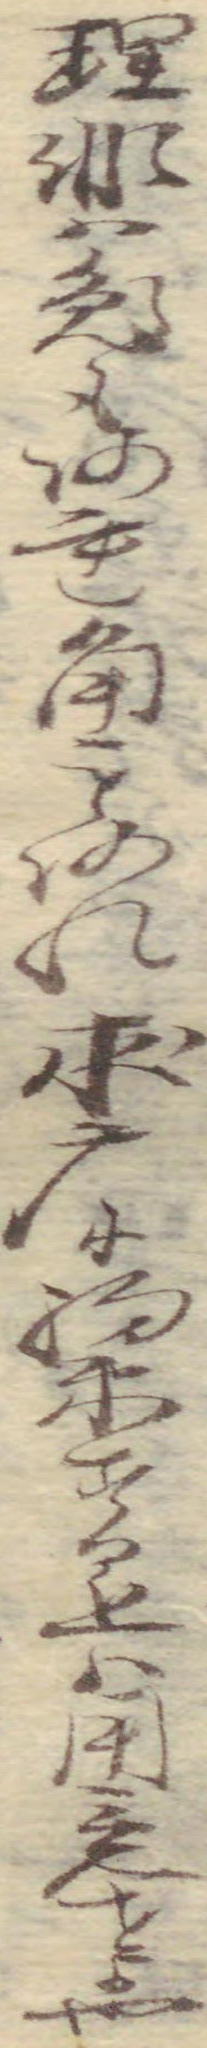理非はともあれ角もあれ求摩に約束する上は用意せよや
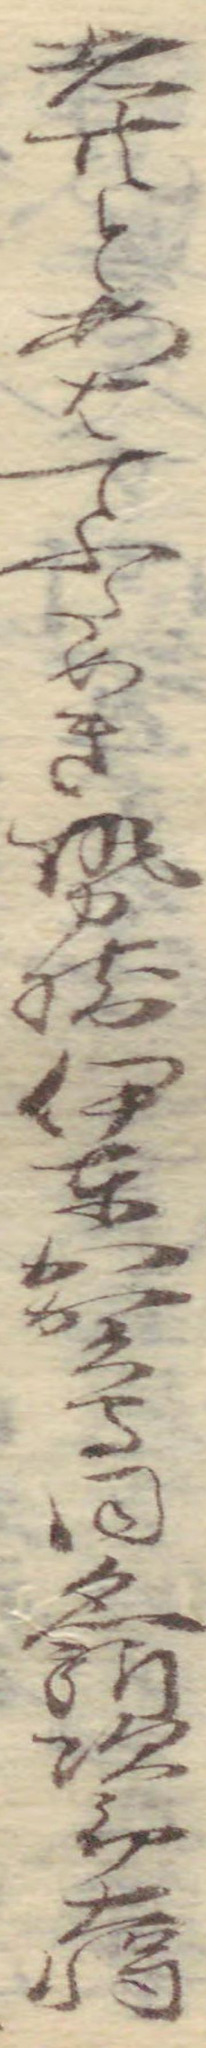者共とあはてふためき勢揃伊東加賀守同名所次郎大将
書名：鶯宿雑記. 巻199-200
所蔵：国立国会図書館 National Diet Library, JAPAN
